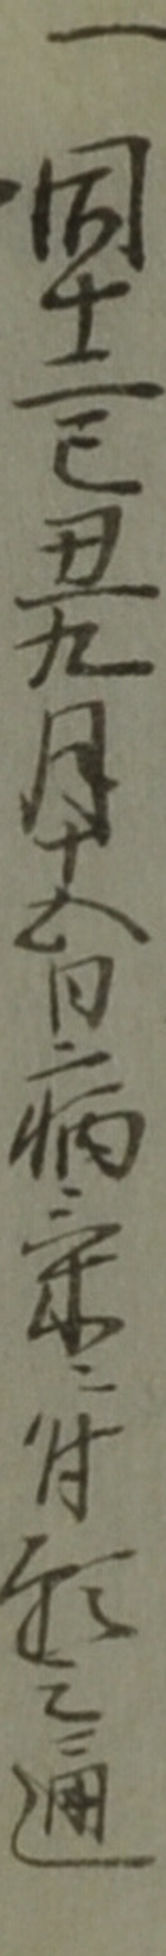一同十二己丑九月十五日病気ニ付願之通
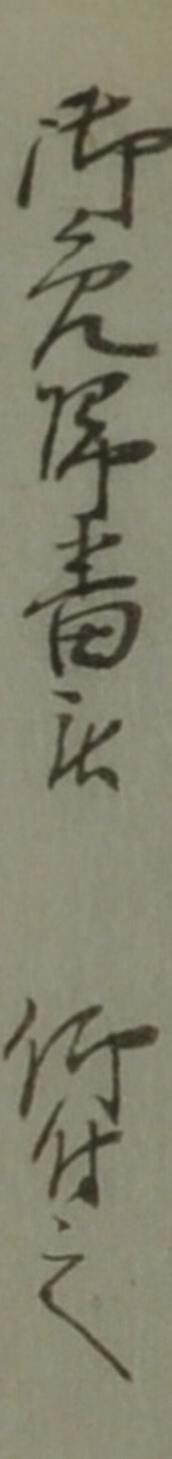御免帰番被仰付之
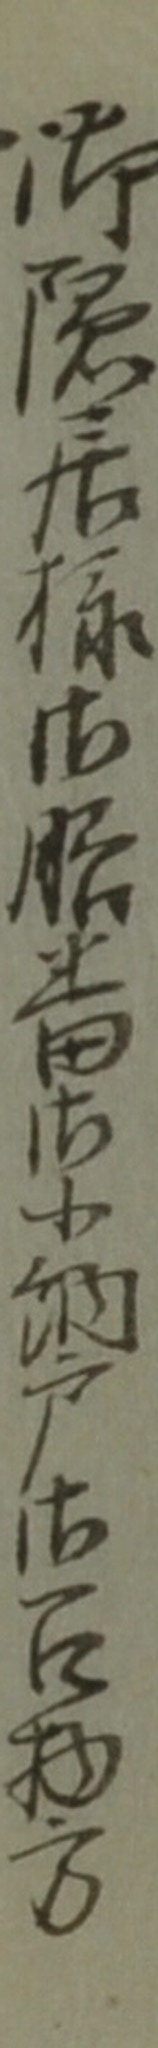御隠居様御膳番御小納戸御召物方
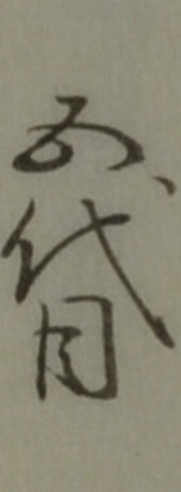五代目
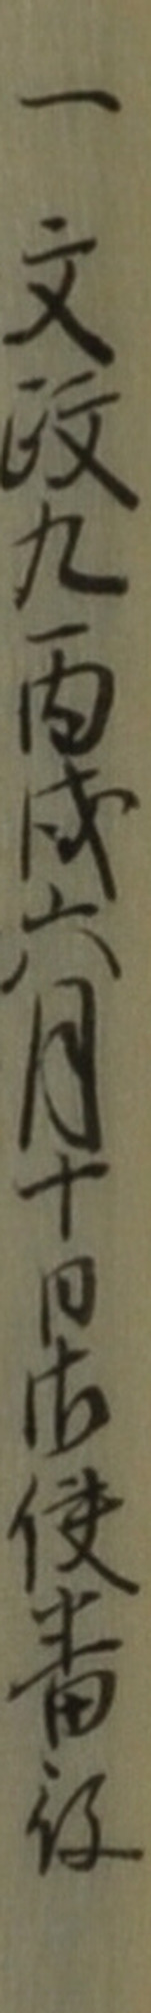一文政九丙戌六月十日御使番役
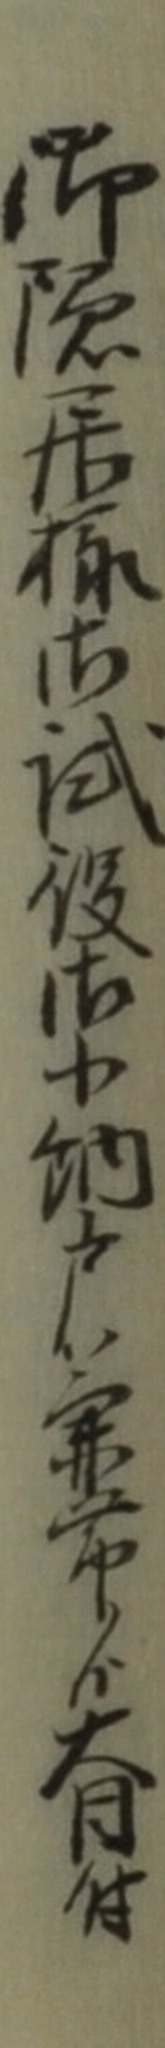御隠居様御試役御小納戸兼帯ゟ大目付
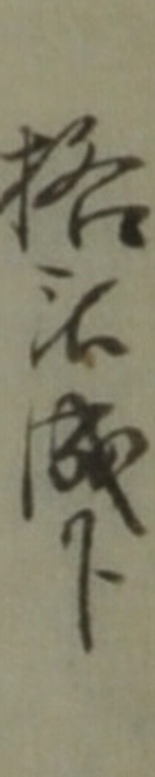格被成下
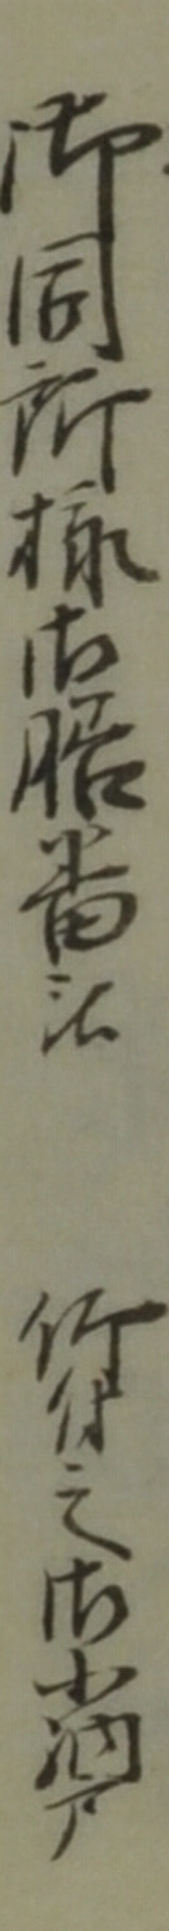御同所様御膳番被仰付之御小納戸
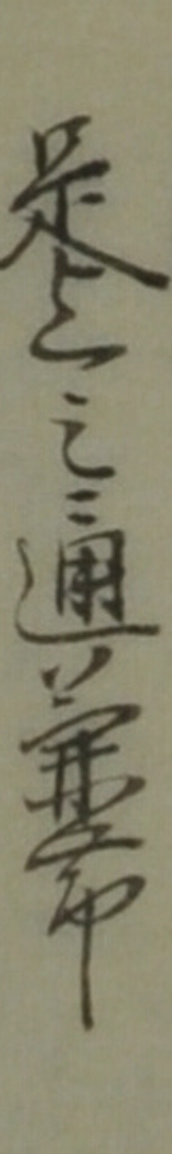是迄之通兼帯
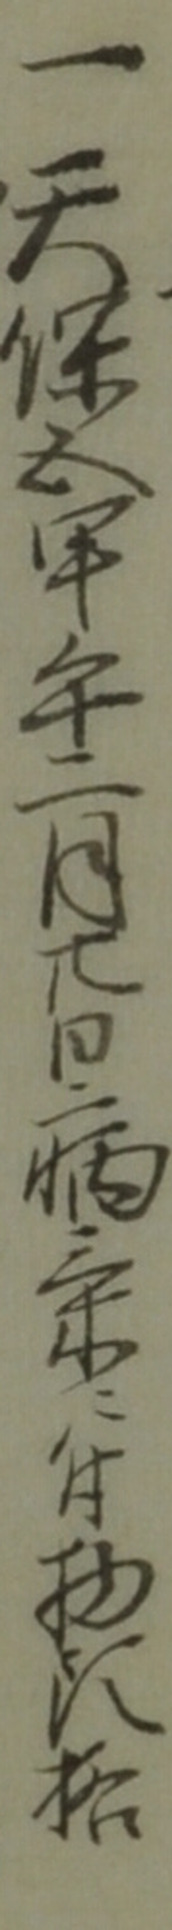一天保五甲午二月廿日病気ニ付物頭格
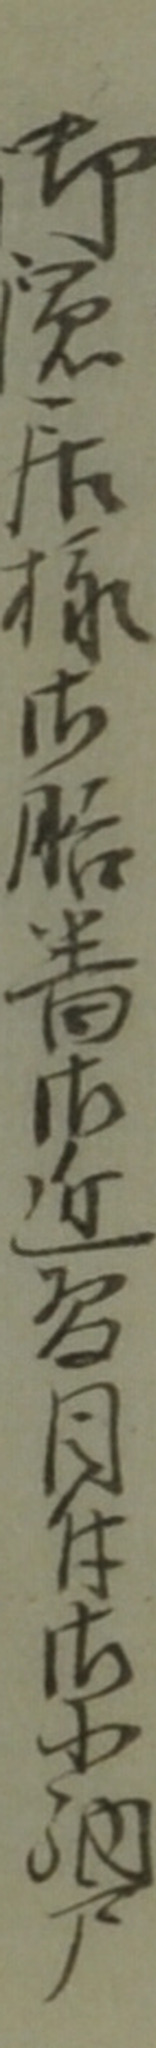御隠居様御膳番御近習目付御小納戸
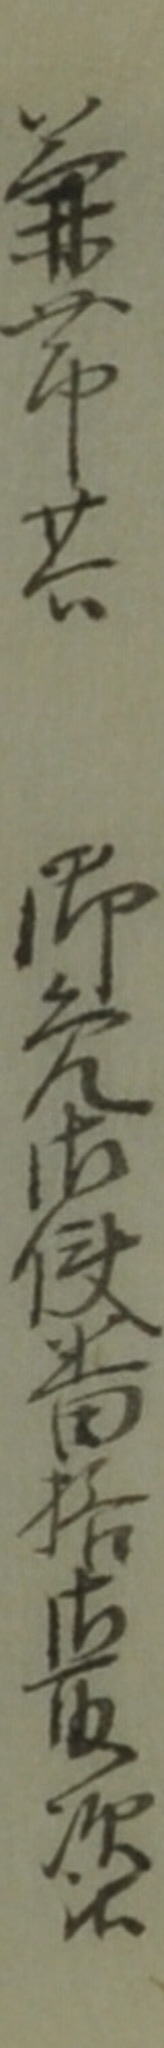兼帯共御免御使番格御取継被
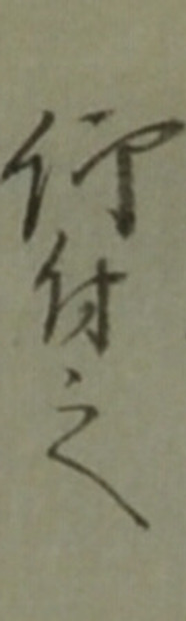仰付之
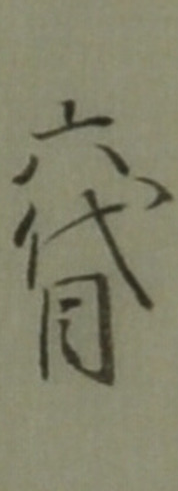六代目
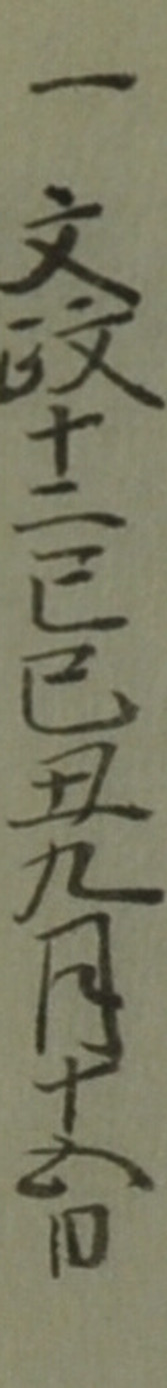一文政十二己巳丑九月十五日
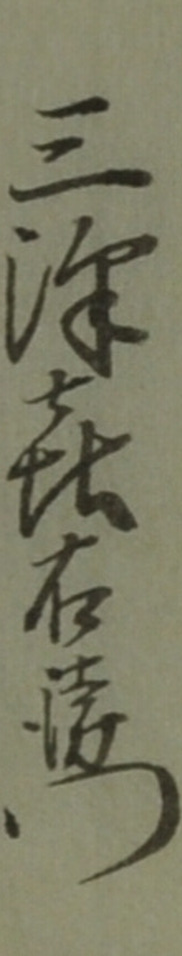三沢喜右衛門
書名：諸御役代々録（四）
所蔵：伊那市立高遠町図書館・合同会社AMANE
